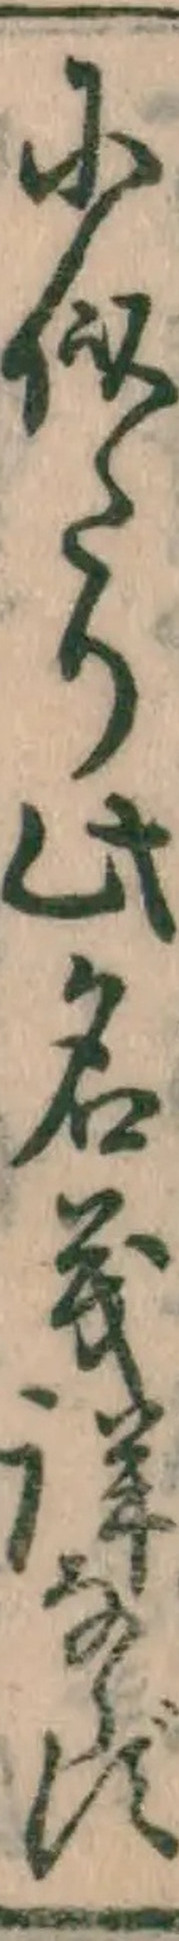に似たり此名義詳ならず
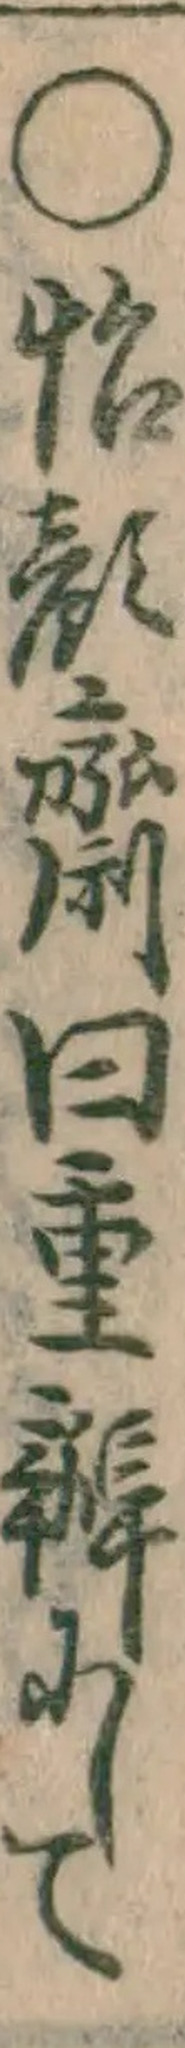○怡顔斎曰重弁にして
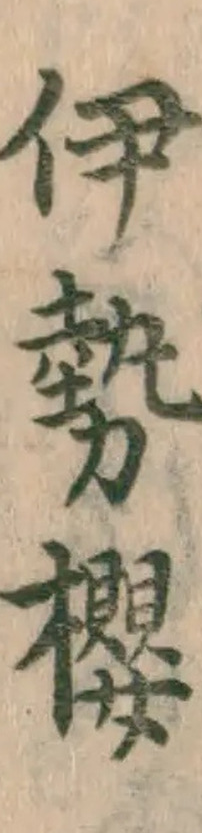伊勢桜
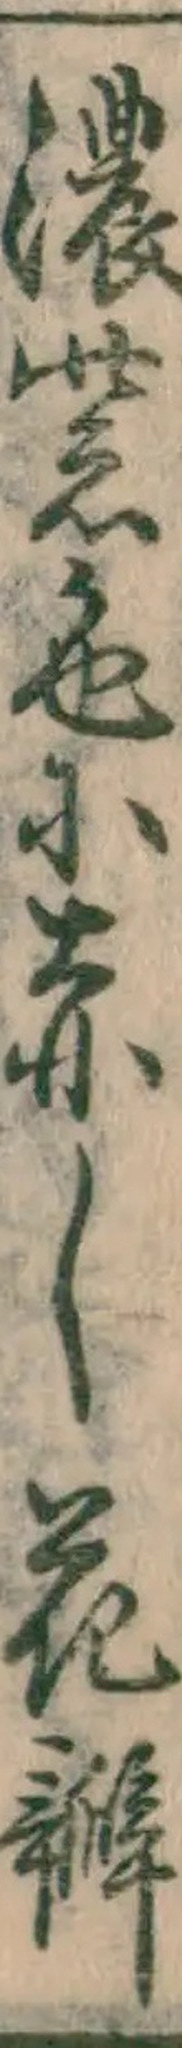濃紫色に赤し花弁
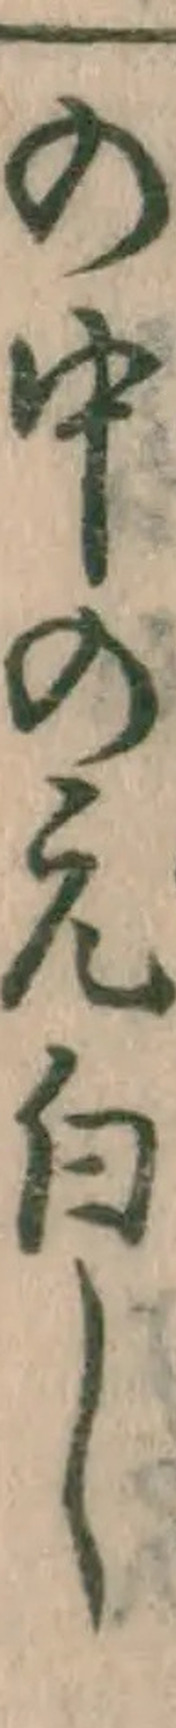の中の元白し
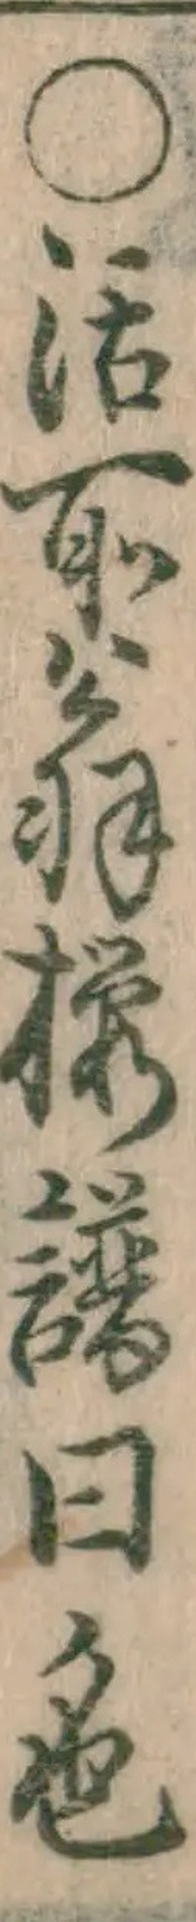○活所翁桜譜曰色
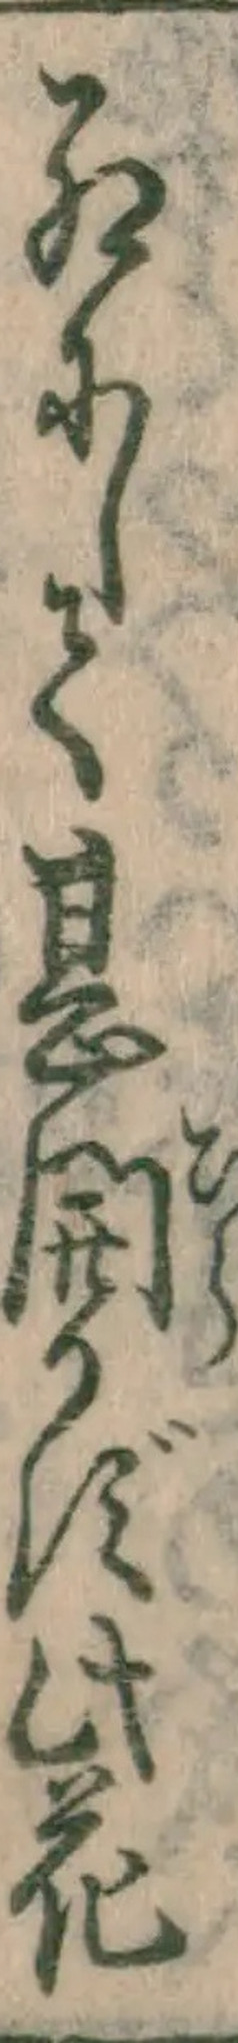紅にして甚開かず此花
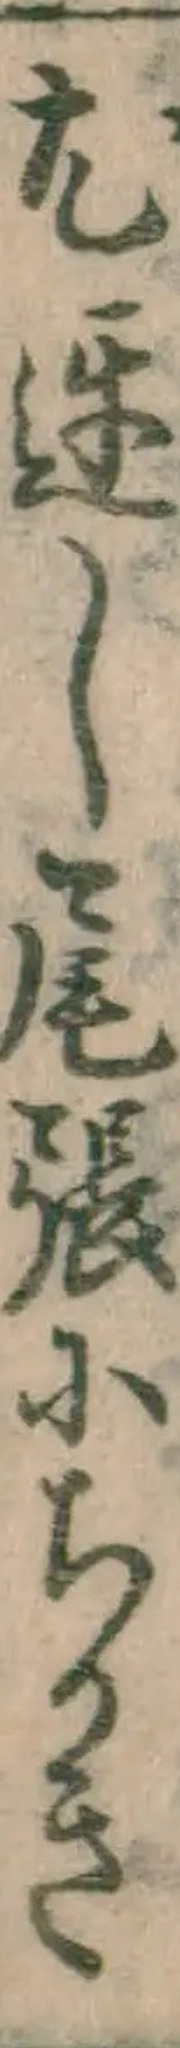尤遅し尾張にちかき
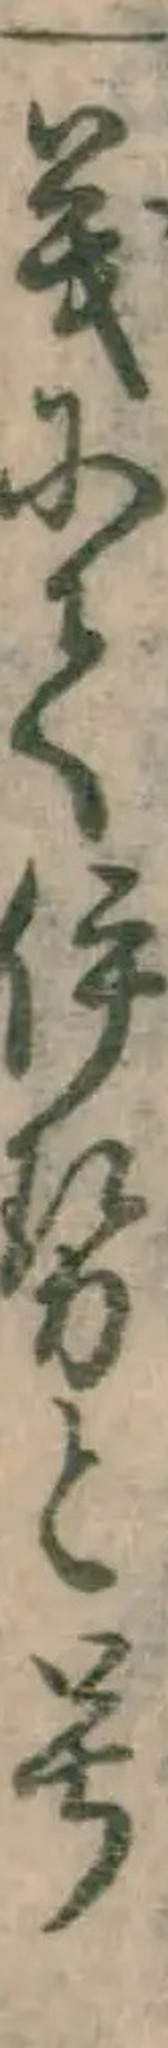義にて伊勢と号

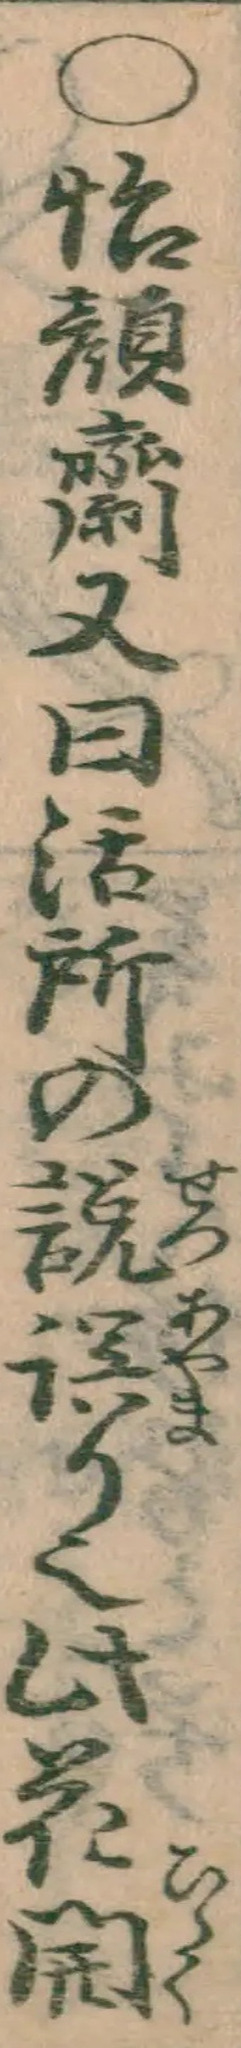○怡顔斎又曰活所の説誤り也此花開
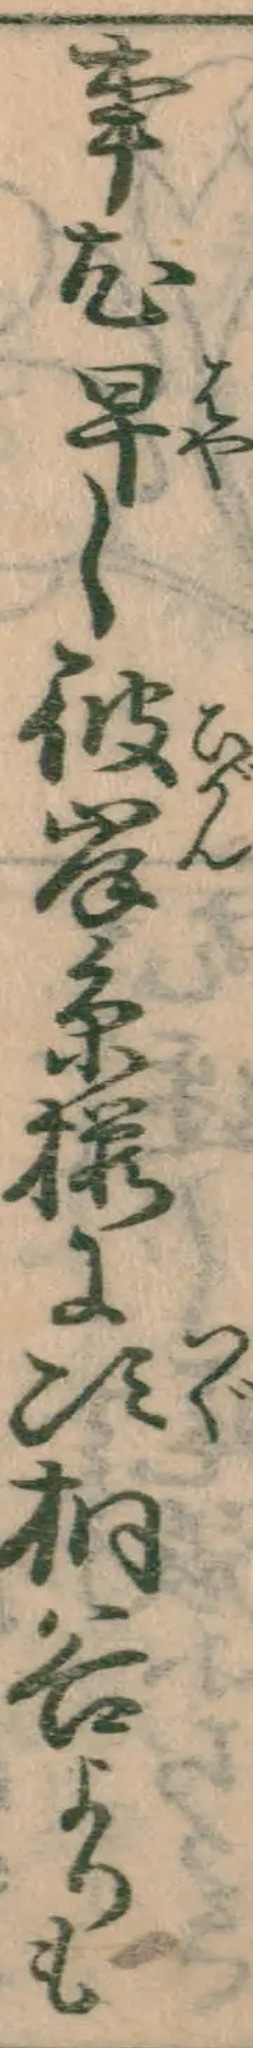事尤早し彼岸糸桜に次桐谷よりも
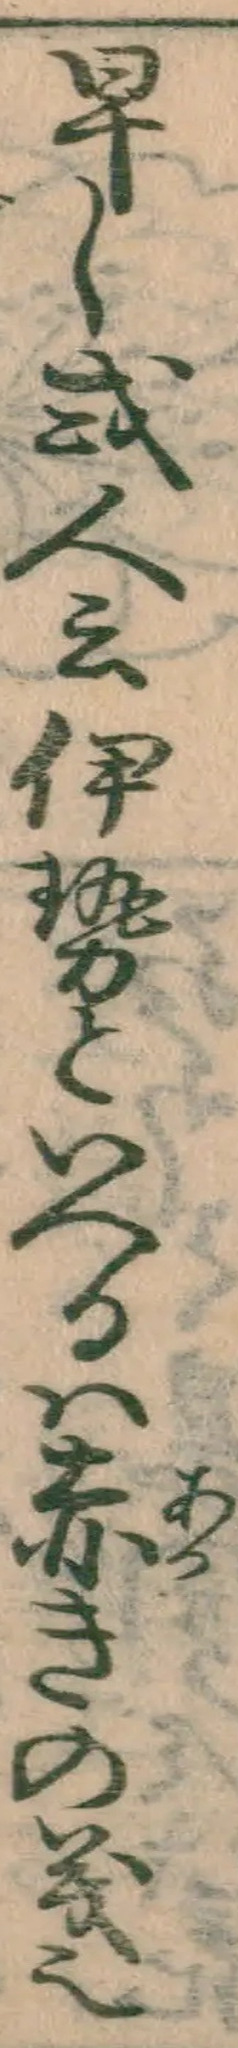早く或人云伊勢といへるは赤きの義也
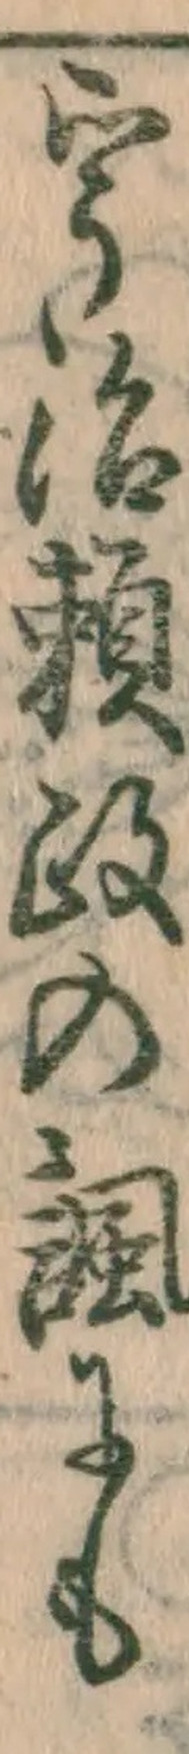宇治頼政の諷にも
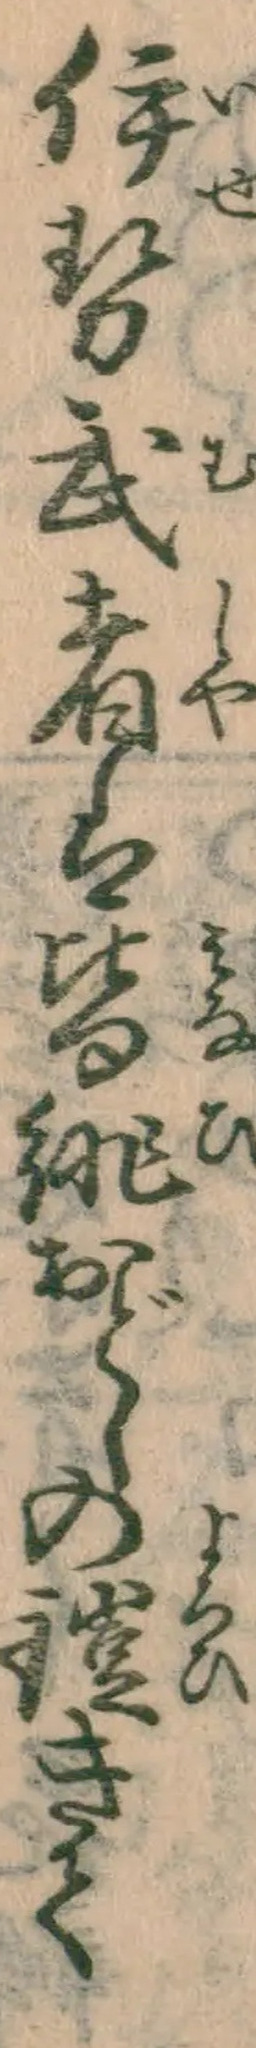伊勢武者は皆緋おどしの鎧きて
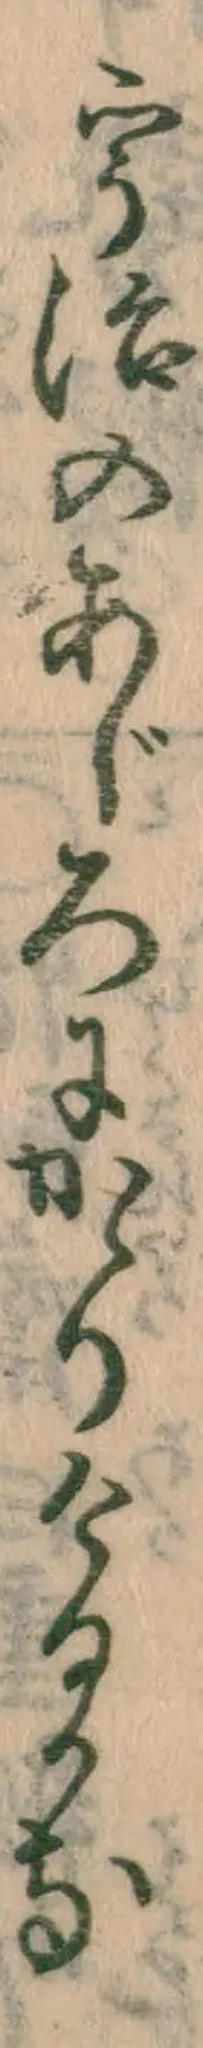宇治のあじろにかゝりけるかな
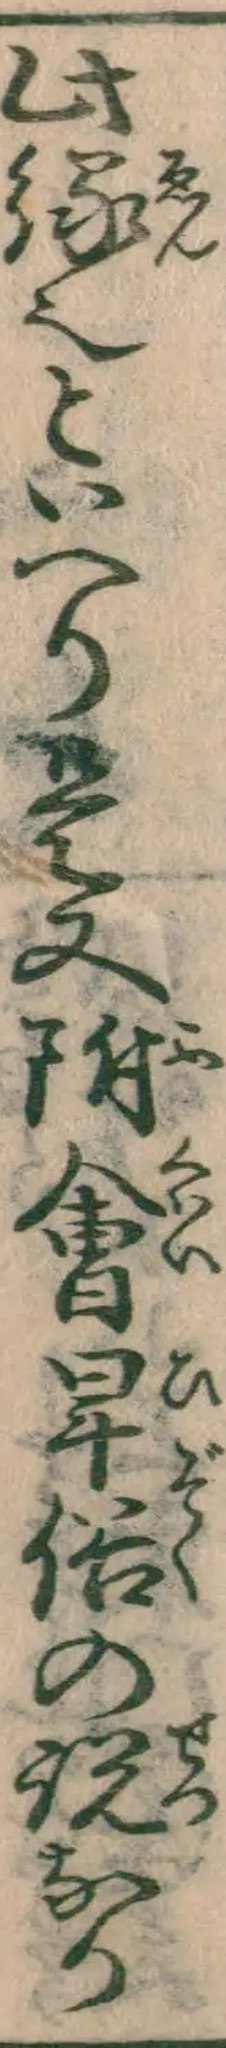此縁也といへり是又附会卑俗の説なり
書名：怡顔齋櫻品
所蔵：国立国会図書館 National Diet Library, JAPAN
